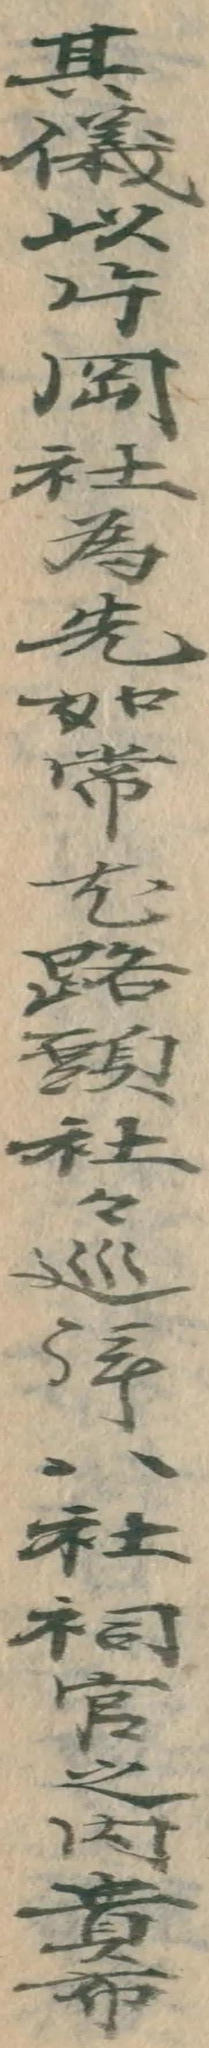其儀以片岡社為先如常尤路頭社々巡拝八社祠官之内貴ふ

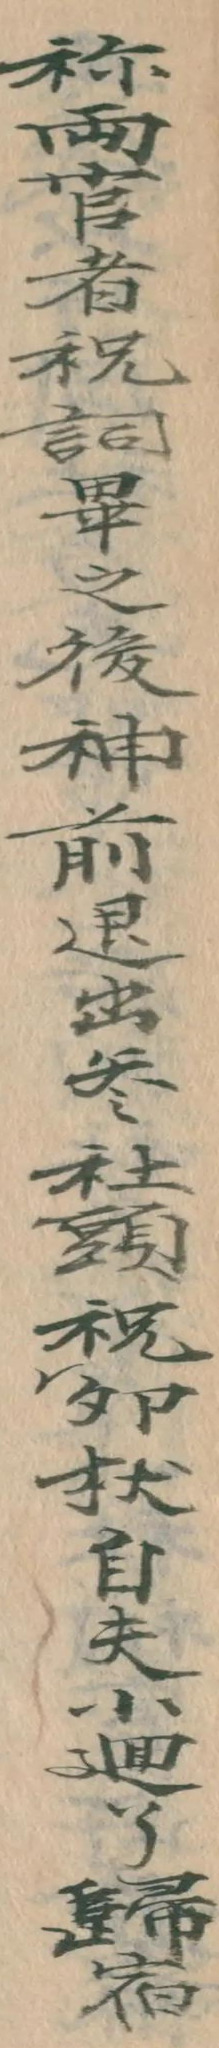ね両官者祝詞畢之後神前退出参社頭祝卯杖自夫小廻了帰宿
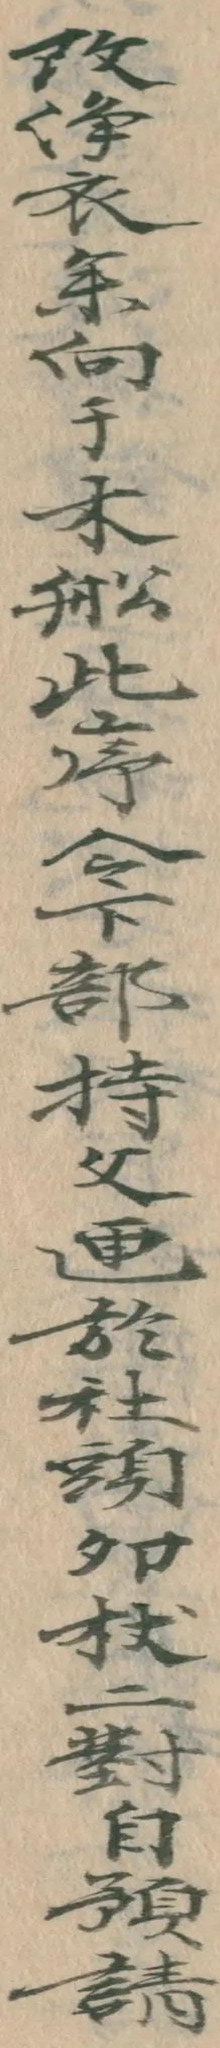改浄衣参向于木船此序令下部持父匣於社頭卯杖二対自預請
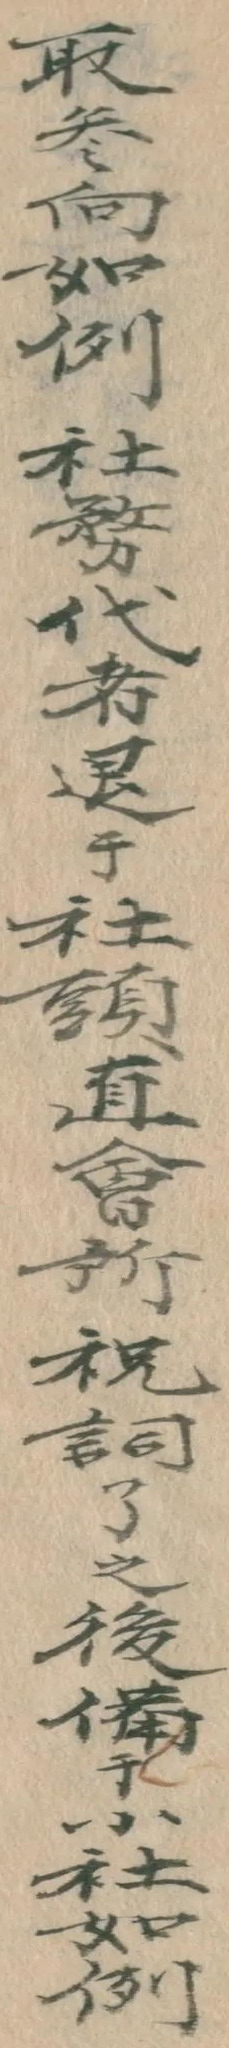取参向如例社務代者退于社頭直会所祝詞了之後備于小社如例
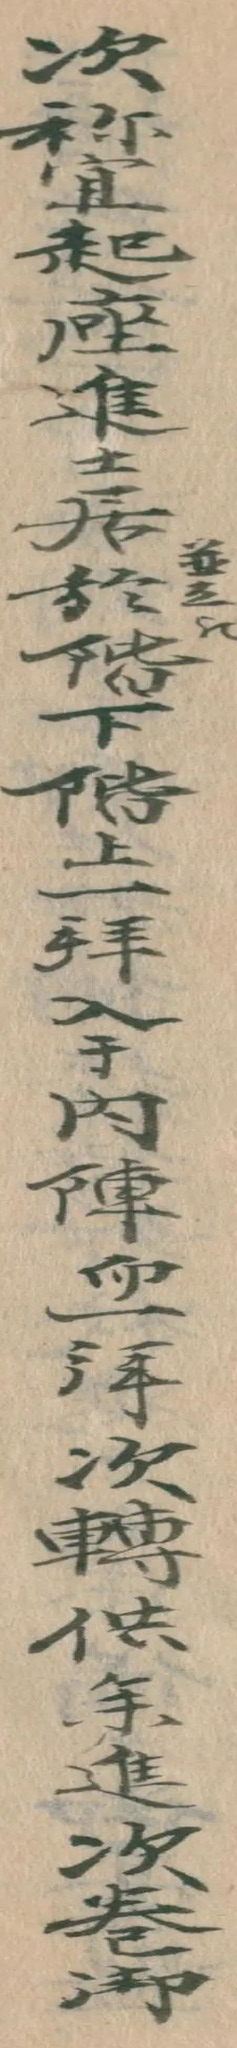次祢宜起座進土居於階下階上一拝入于内陣而一拝次転供参進次巻御
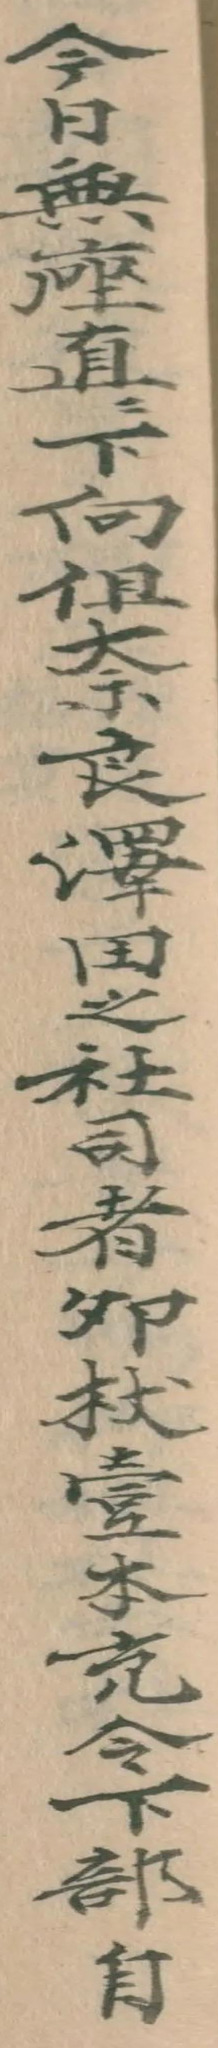今日無座直ニ下向但奈良沢田之社司者卯杖壱本充令下部自
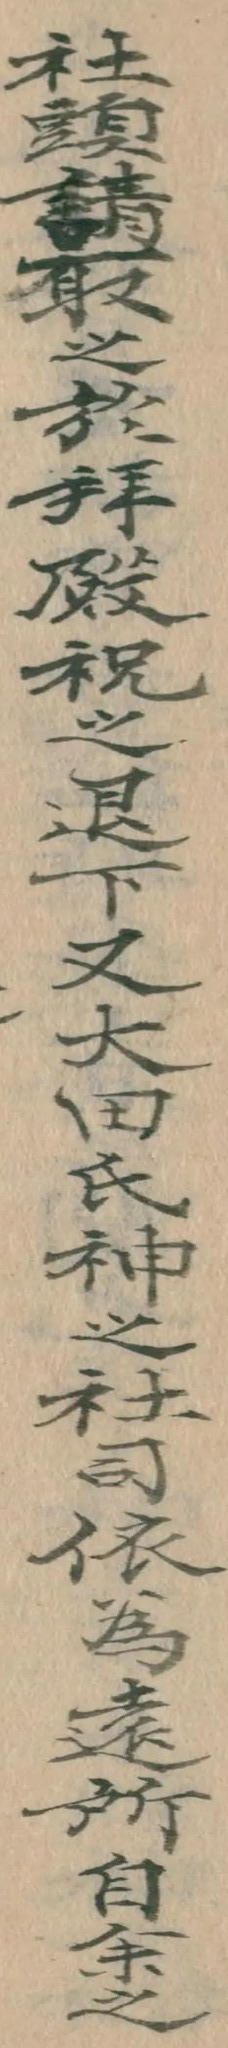社頭請取之於拝殿祝之退下又大田氏神之社司依為遠所自余之
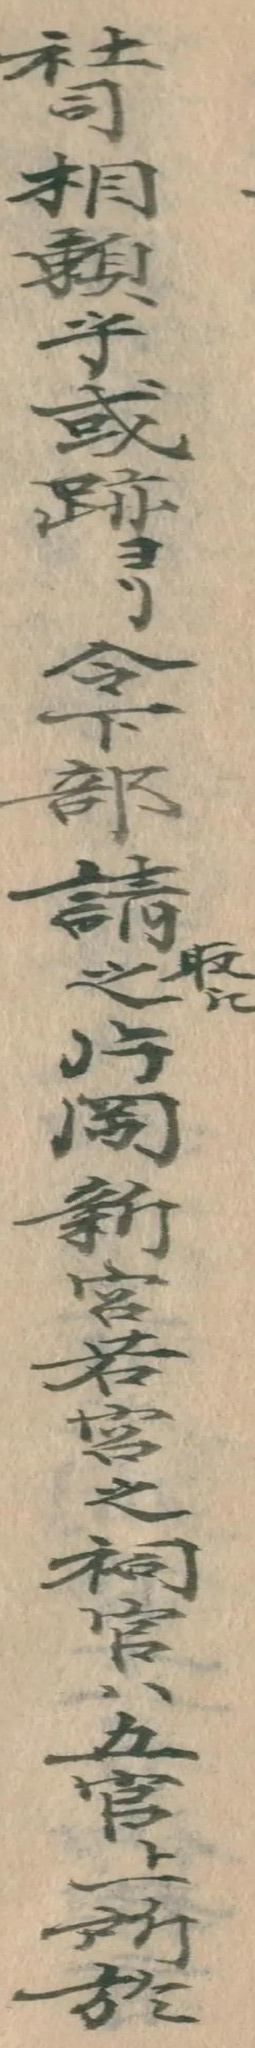社司相頼乎或跡ヨリ令下部請之片岡新宮若宮之祠官ハ五宮ト一所於
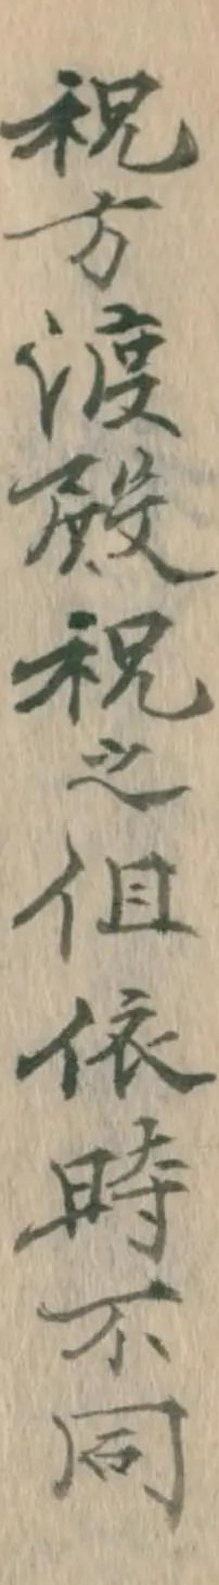祝方渡殿祝之但依時不同
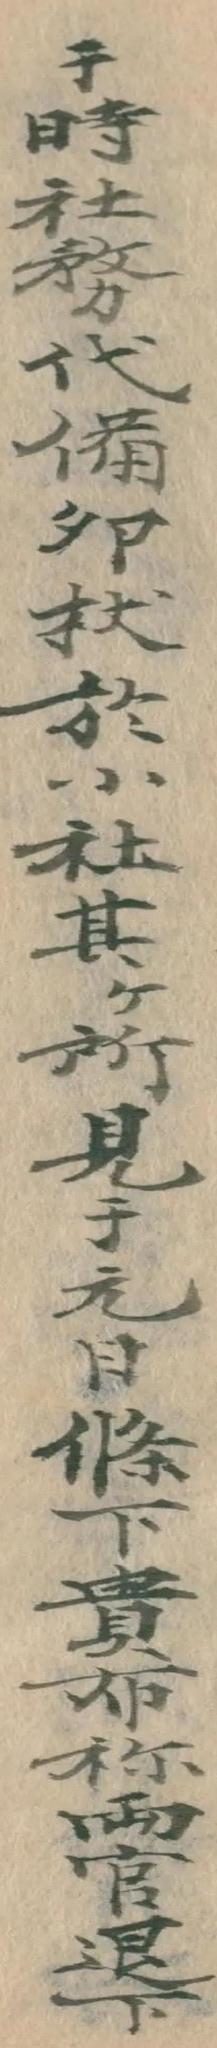于時社務代備卯杖於小社其ケ所見于元日條下貴ふね両官退下
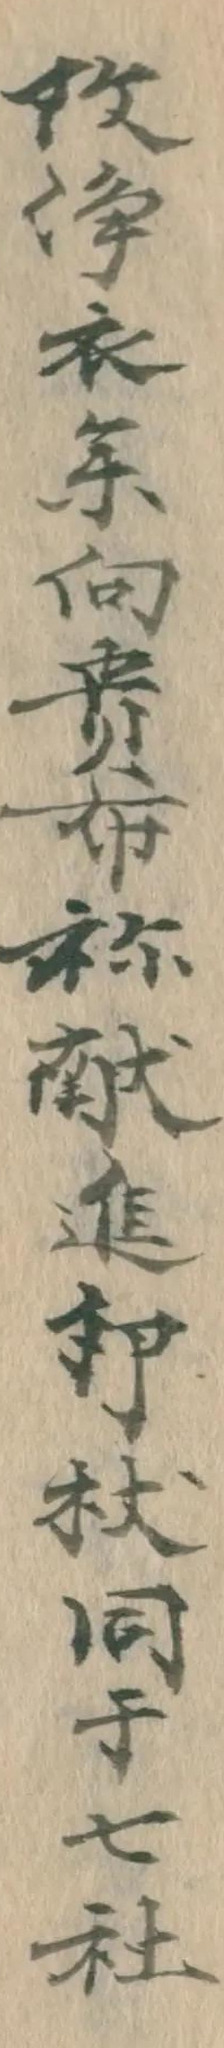改浄衣参向貴ふね献進卯杖同于七社

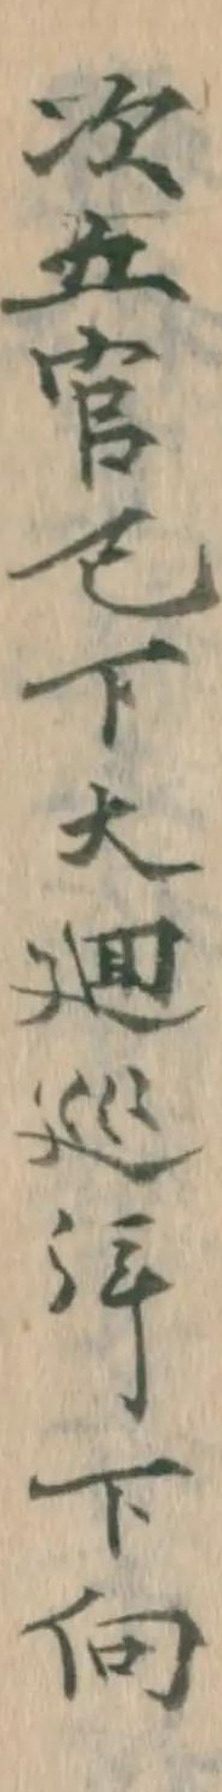次五官已下大廻巡拝下向
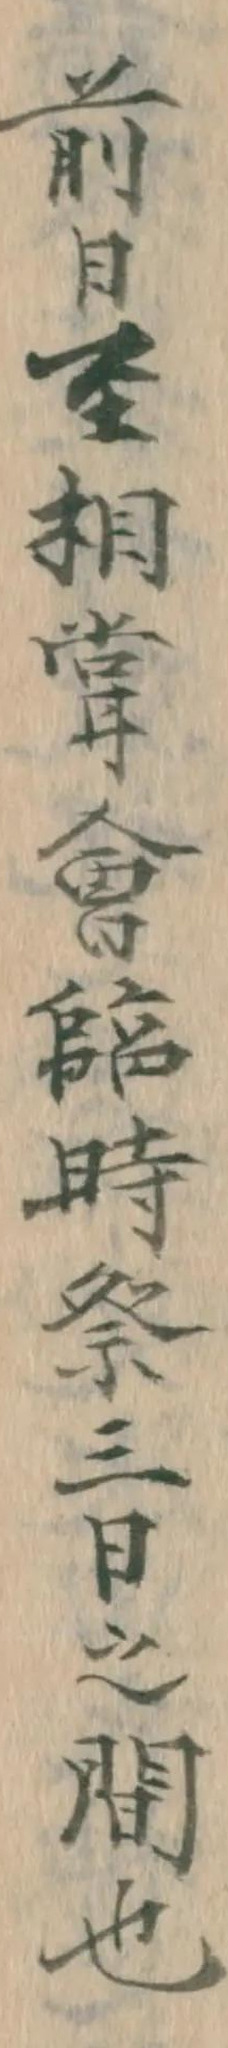前日至相嘗会臨時祭三日之間也

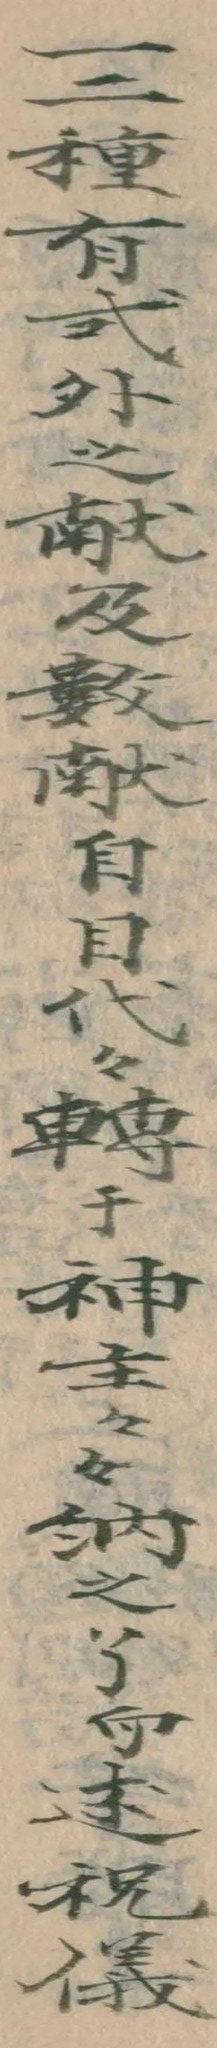一二種有式外之献及数献自目代々転于神主々々納之了而述祝儀
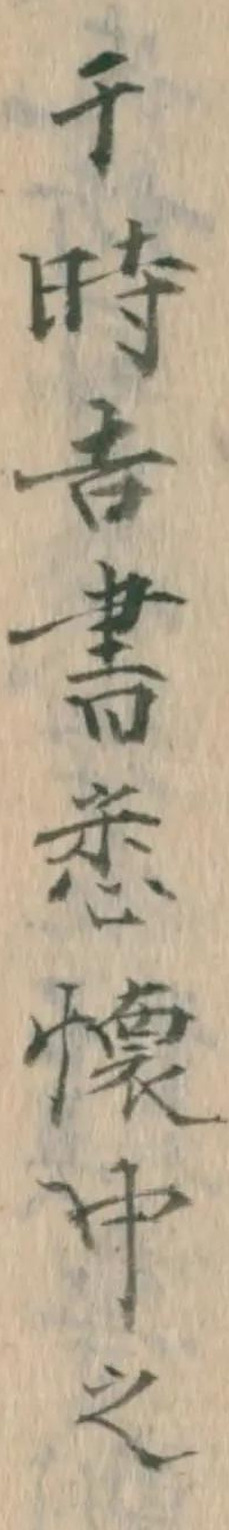于時吉書悉懐中之
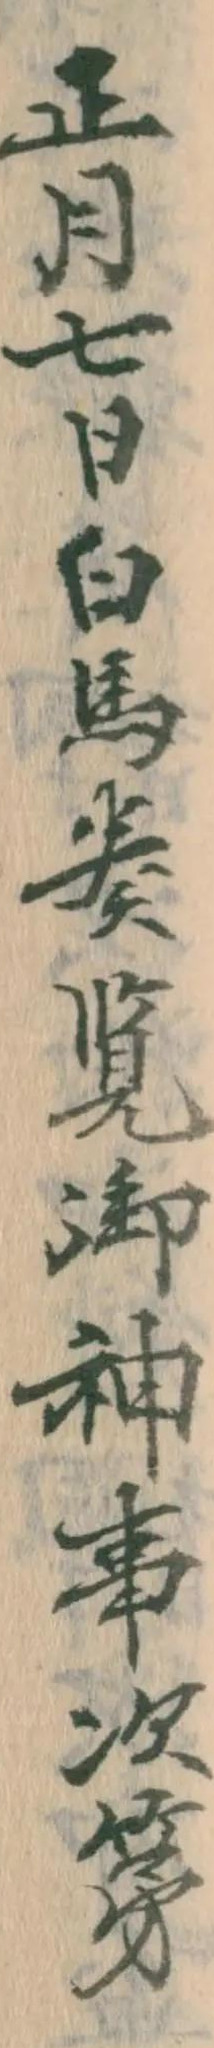正月七日白馬奏覧御神事次第
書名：賀茂社記録. 第9冊
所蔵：国立国会図書館 National Diet Library, JAPAN
